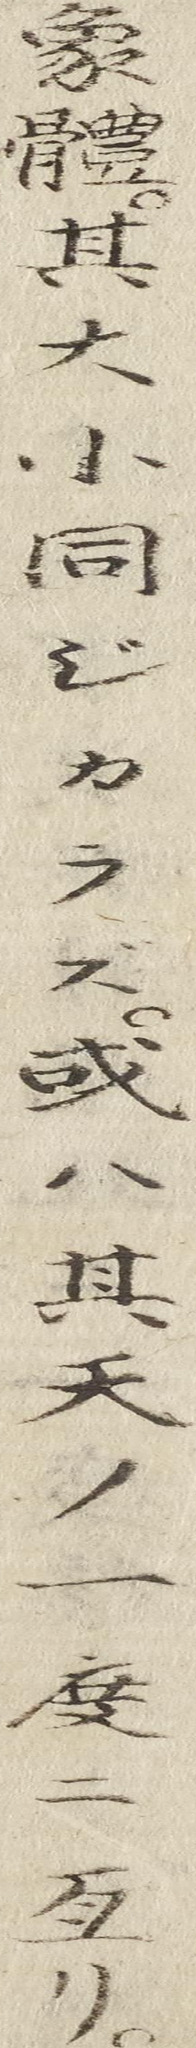象体。其大小同ジカラズ。或ハ其天ノ一度ニ亙リ。
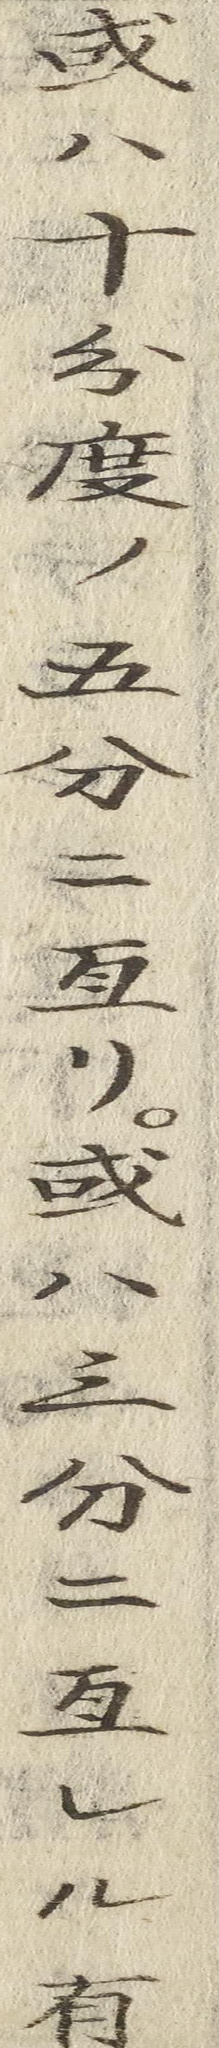或ハ十分度ノ五分ニ亙リ。或ハ三分ニ亙レル有
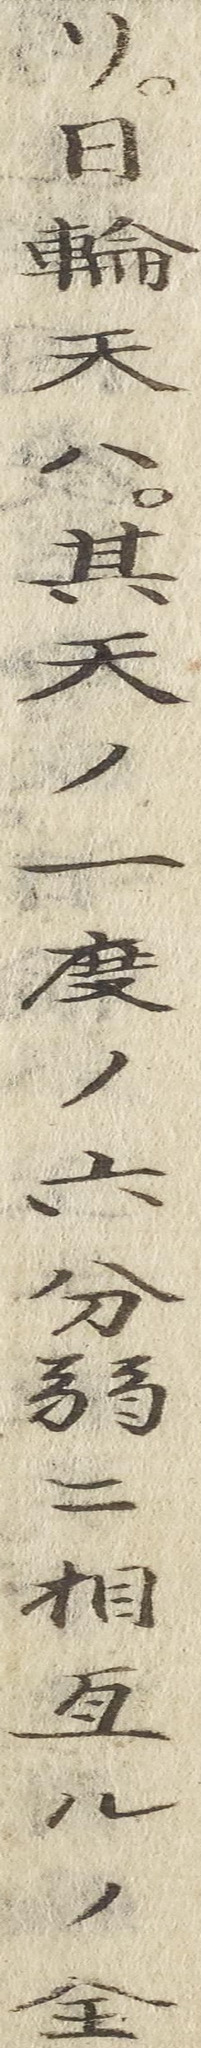リ。日輪天ハ。其天ノ一度ノ六分弱ニ相亙ルノ全
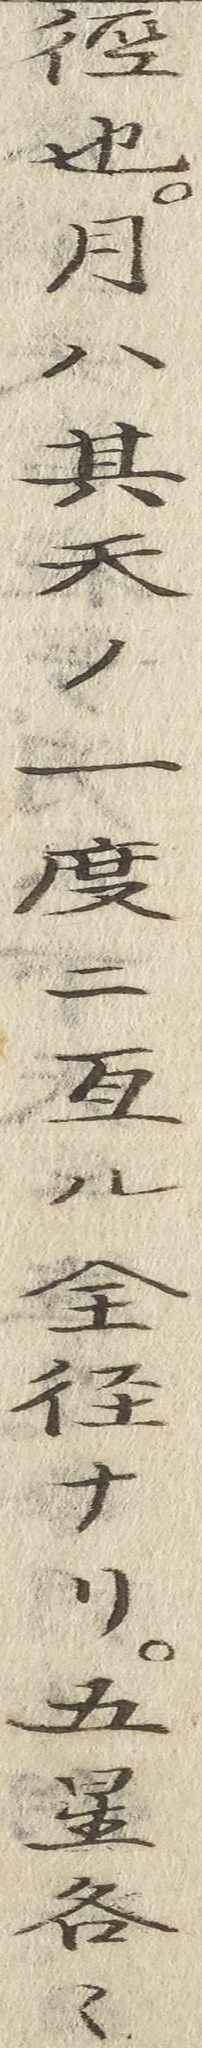径也。月ハ其天ノ一度ニ亙ル全径ナリ。五星各々
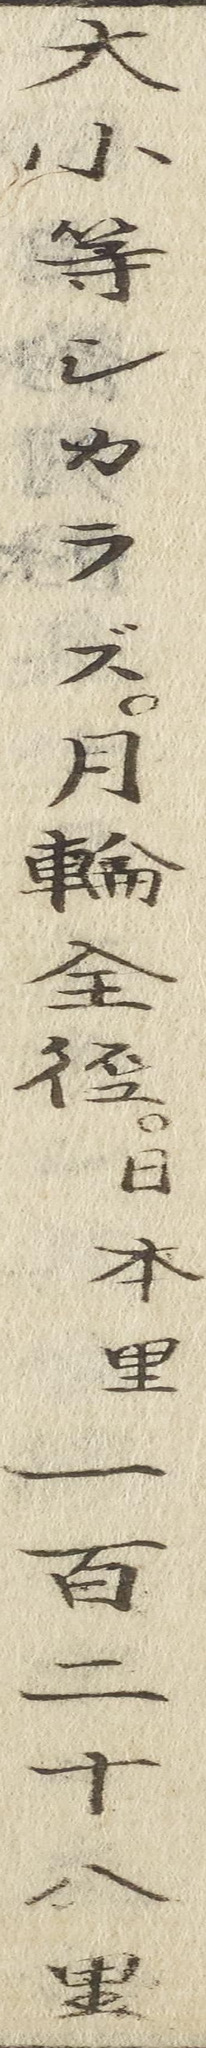大小等シカラズ。月輪全径。日本里一百二十八里
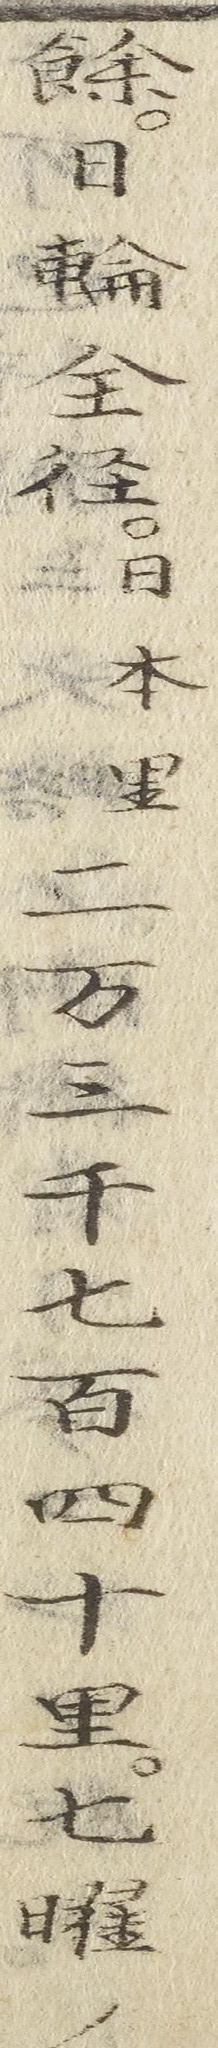余。日輪全径。日本里二万三千七百四十里。七曜ノ
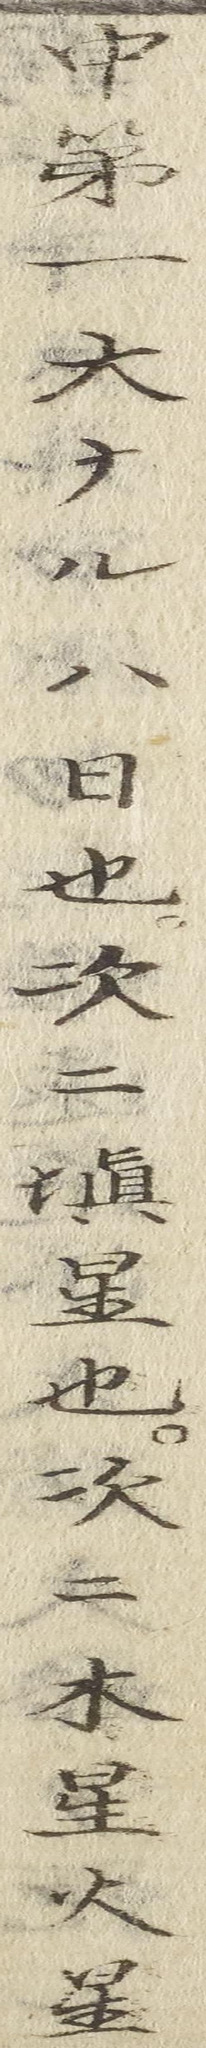中第一大ナルハ日也。次ニ填星也。次ニ木星火星
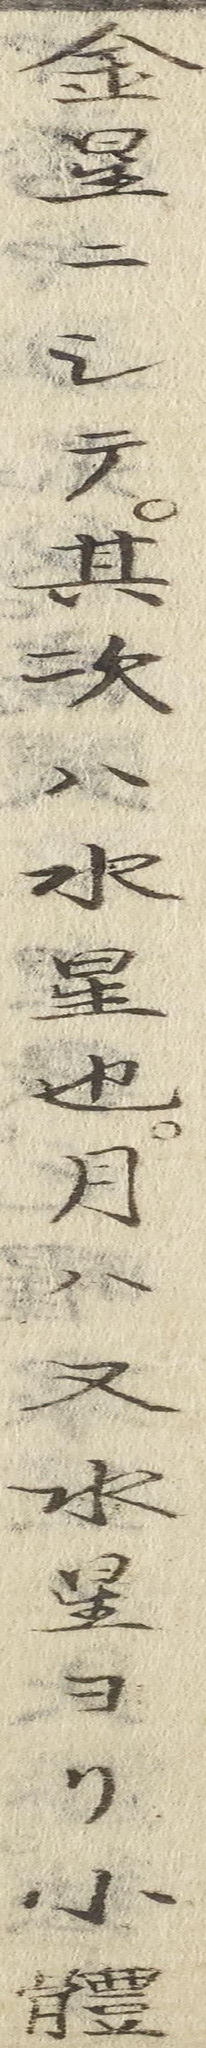金星ニシテ。其次ハ水星也。月ハ又水星ヨリ小体
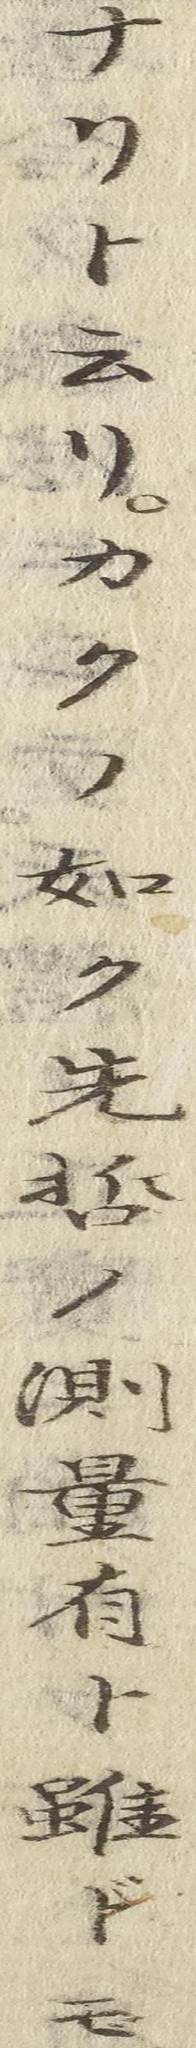ナリト云リ。カクノ如ク先哲ノ測量有ト雖ドモ。
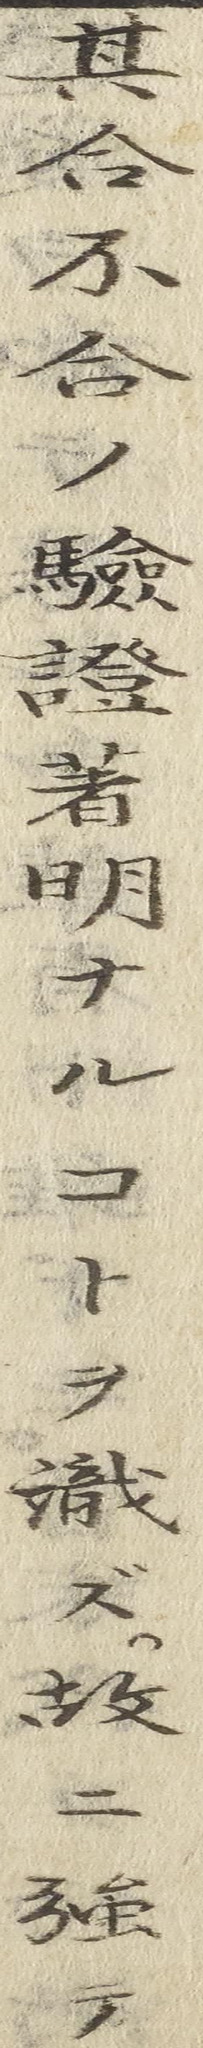其合不合ノ験証著明ナルコトヲ識ズ。故ニ強テ
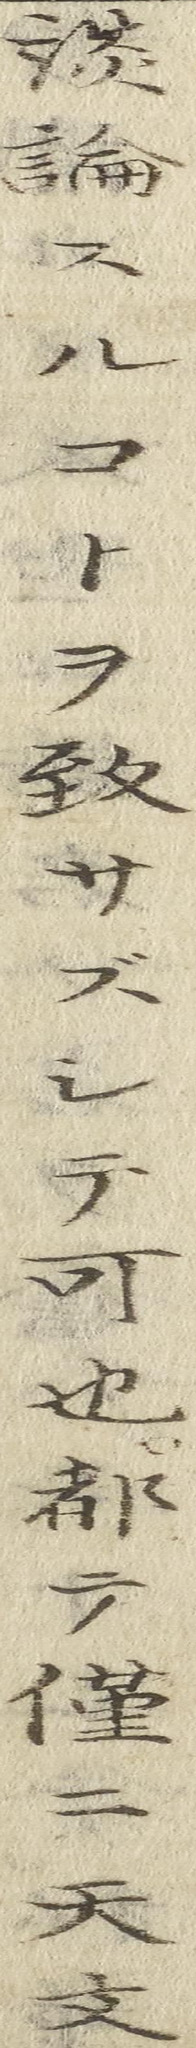談論スルコトヲ致サズシテ可也。都テ僅ニ天文

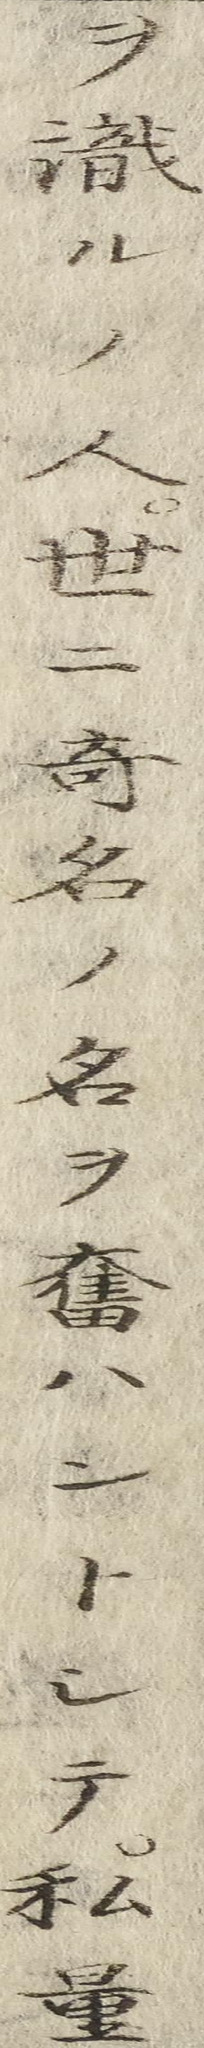ヲ識ルノ人。世ニ奇名ノ名ヲ奮ハシトシテ。私量
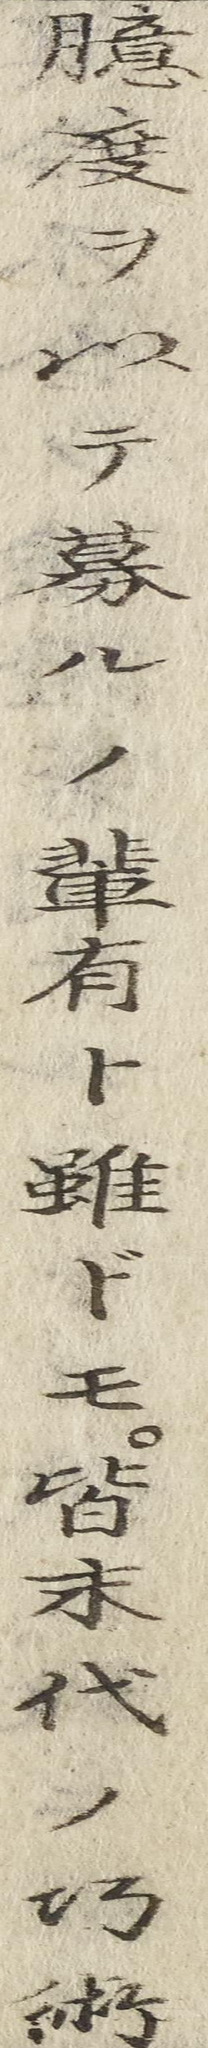臆度ヲ以テ募ルノ輩有ト雖ドモ。皆末代ノ巧術
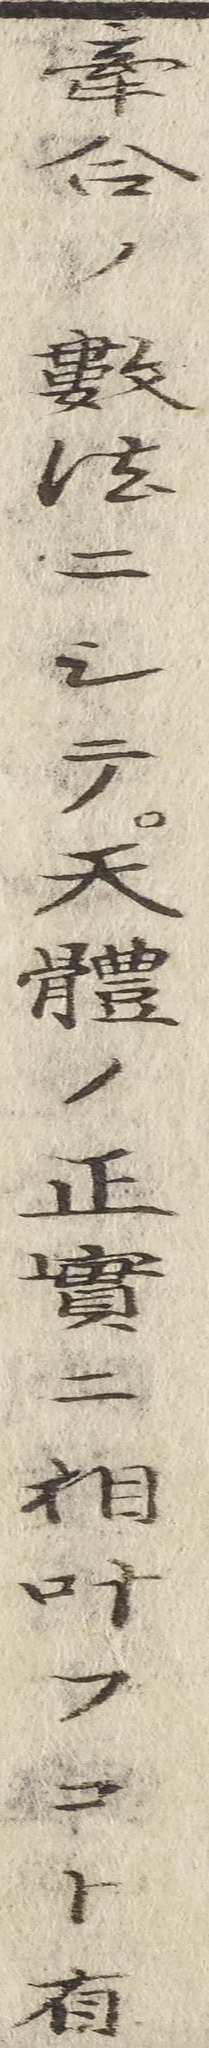牽合ノ数法ニシテ。天体ノ正実ニ相叶フコト有
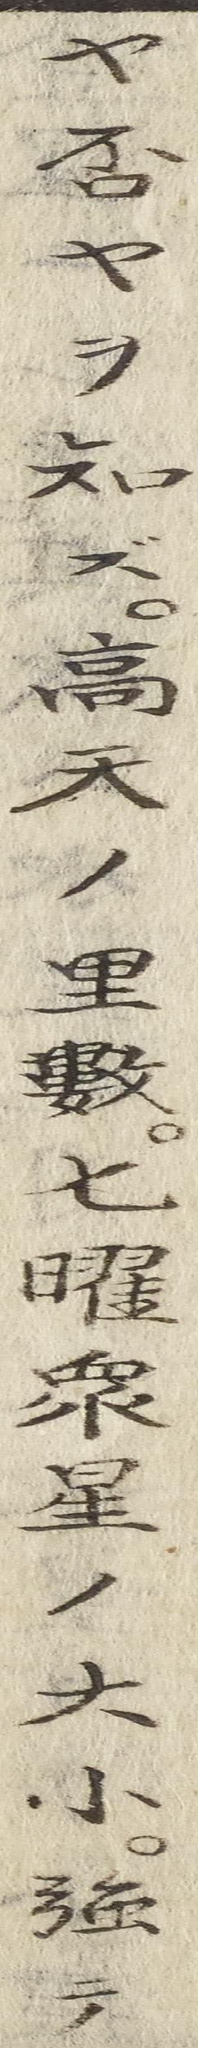ヤ否ヤヲ知ズ。高天ノ里数。七曜衆星ノ大小。強テ
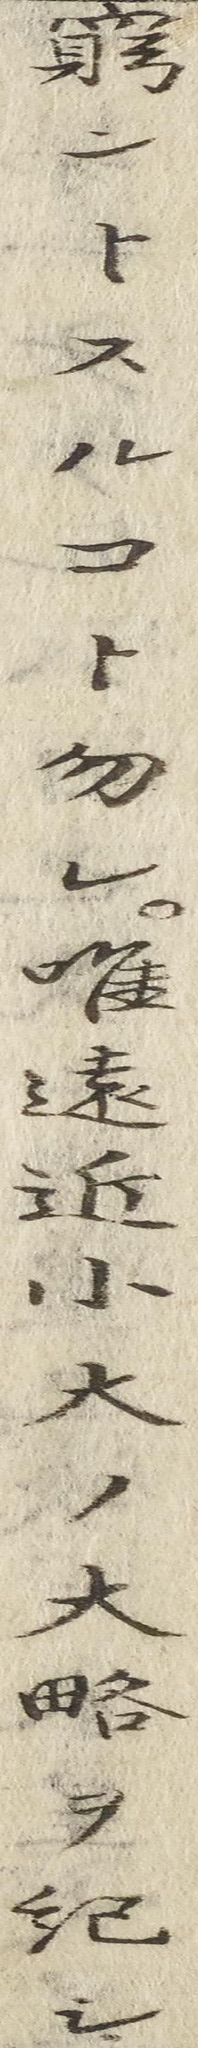窮ントスルコト勿レ。唯遠近小大ノ大略ヲ記シ
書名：大略天学名目鈔　天經或問附録
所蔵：東京大学地震研究所図書室 Earthquake Research Institute Library, The University of Tokyo, JAPAN
